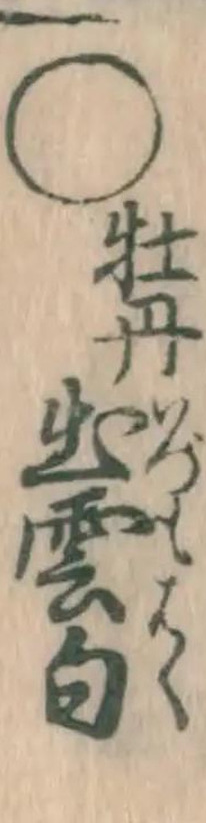〇牡丹出雲白
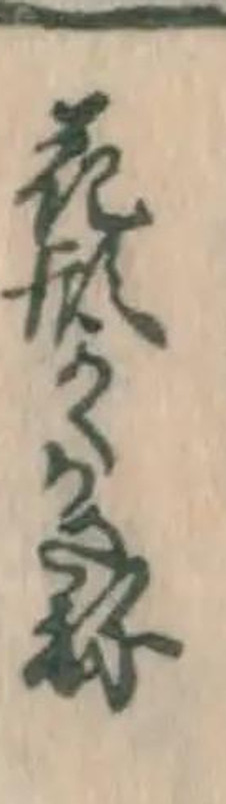花形よくかさね
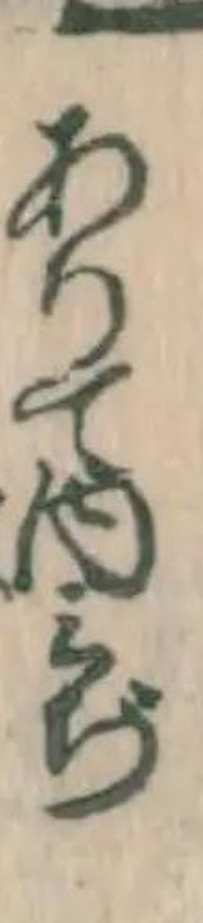ありて内みぢ
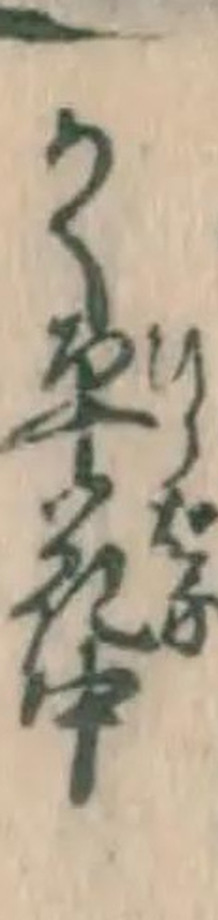かく平花中
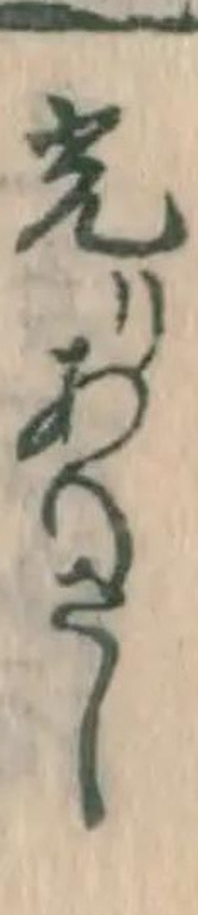光りありさし
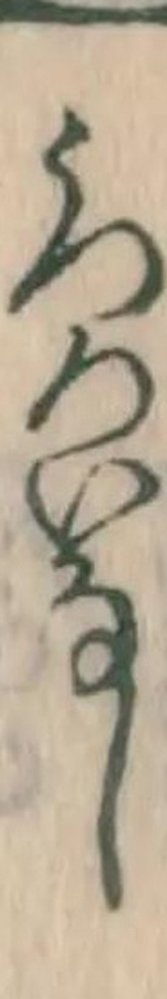くつろいなし
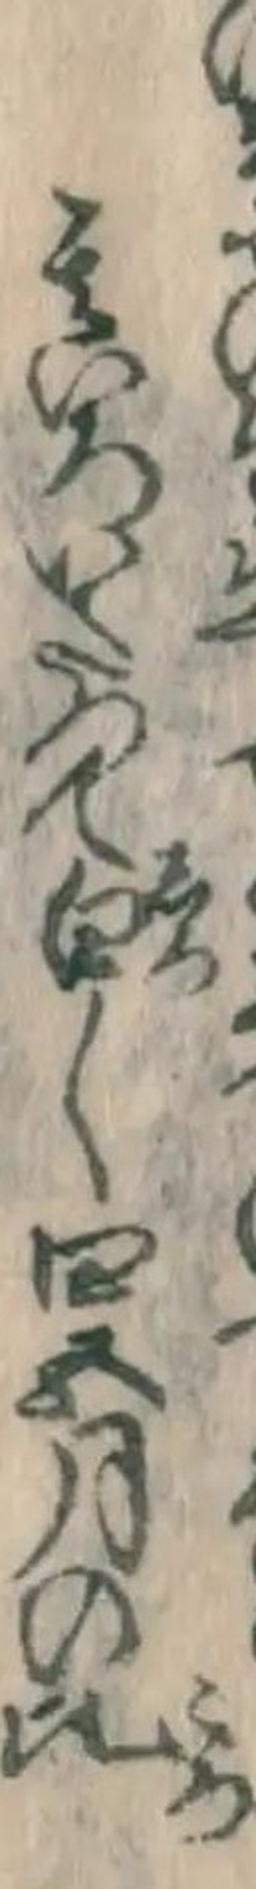其いろいたつて白く四五月の比
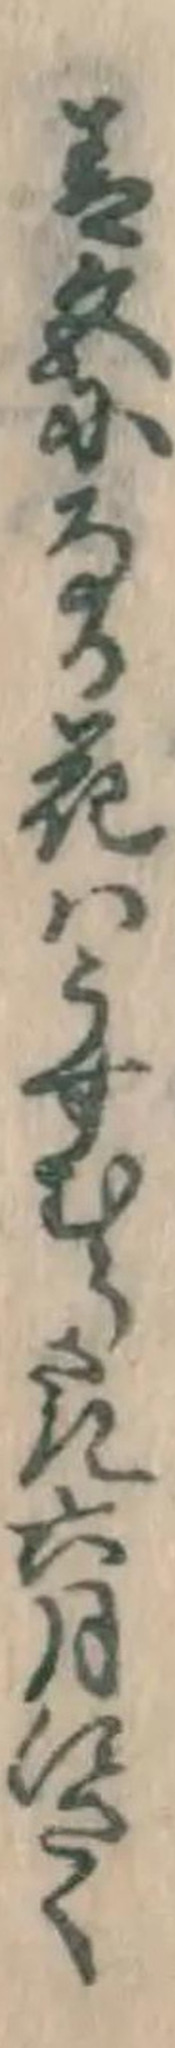青色になり花はうすむらさき六月にさく

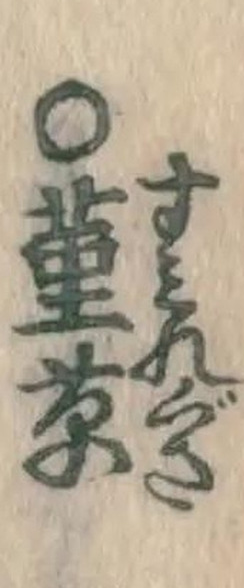○菫草
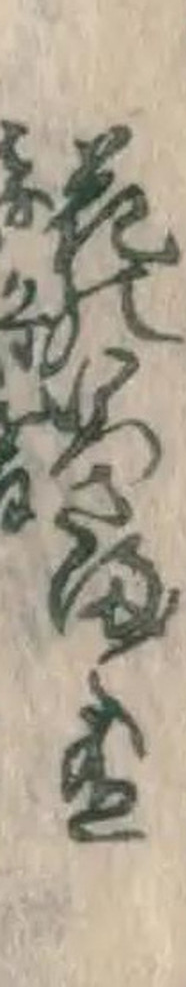花のいろさま〳〵有
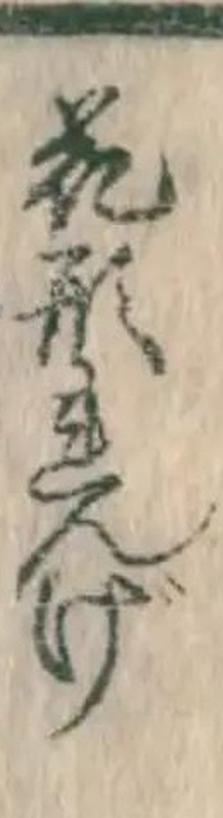花形れんげ
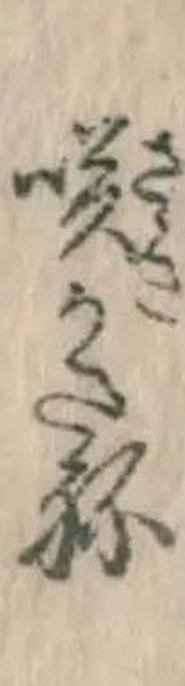咲かさね
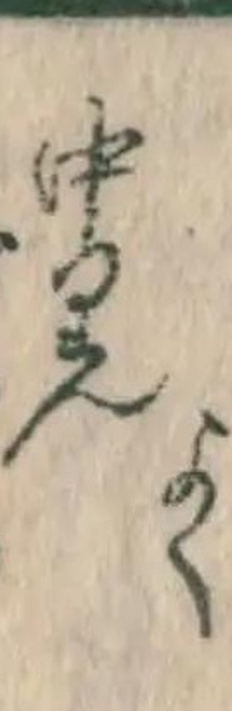中りん
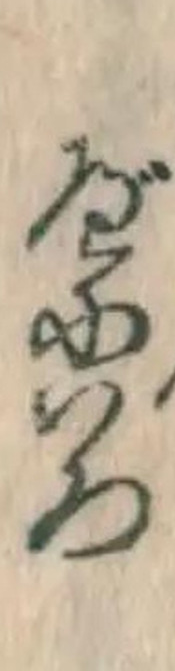べにいろ
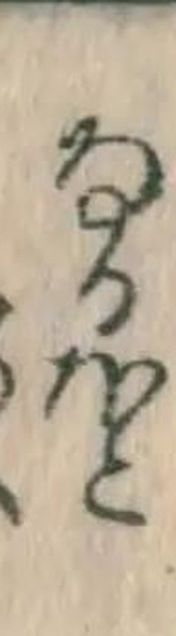なるほと
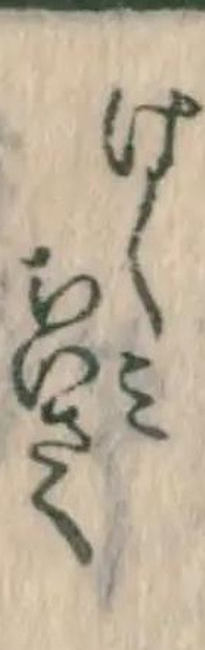ちいさく
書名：艸花繪前集. [1]
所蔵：国立国会図書館 National Diet Library, JAPAN
